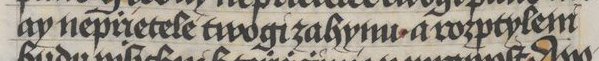ay nepṙietelé twogi zahynu.a rozptyleni
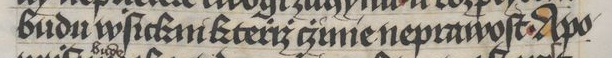budu wẛickni kteṙiż cżinie neprawoſt.Apo¬
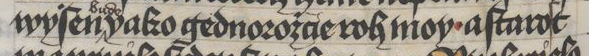wyẛeni bude yako gednorożcie roh moy.aſtaroſt
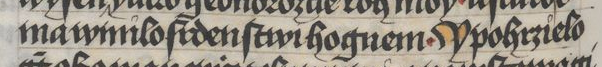ma wmiloſrdenſtwi hognem.Y pohrzielo
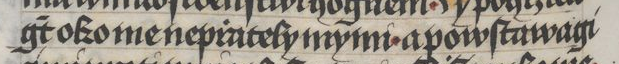ḡt oko me nepṙately mymi.a powſtawagí
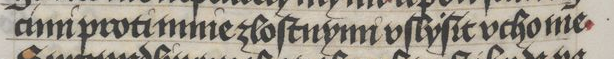cími proti mnie zloſtnymi vſlyẛit vcho me.
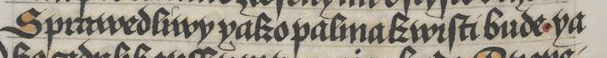Sprawedliwy yako palma kwiſti bude.ya¬
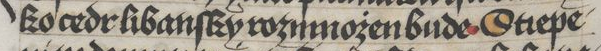ko cedr libanſky rozmnożen bude.Stiepe¬
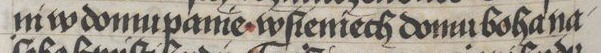ni w domu panie.wſieniech domu boha na¬
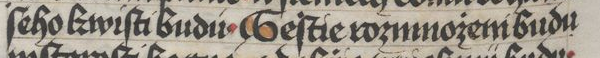ẛ̇eho kwiſti budu.Geẛtie rozmnożeni budu
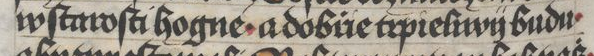wſtaroſti hogne.a dobṙie trpieliwij budu.
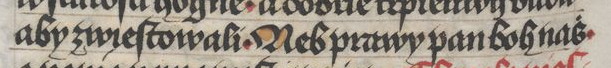aby zwieſtowali.Neb prawy pan boh naṡ.
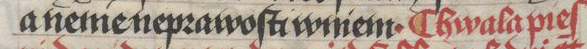a neníe neprawoſti wniem.Chwala pieſ¬
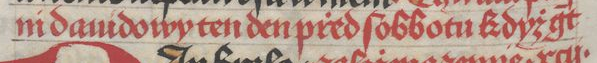ni davidowy ten den pṙed ſobbotu kdyż ḡt
